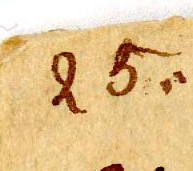25
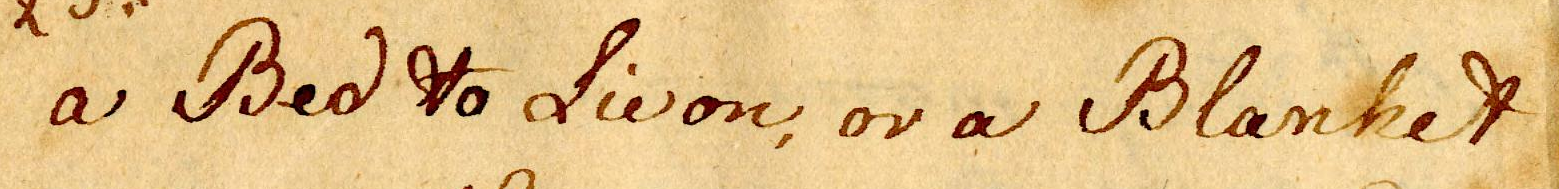a Bed to Lie on, or a Blanket
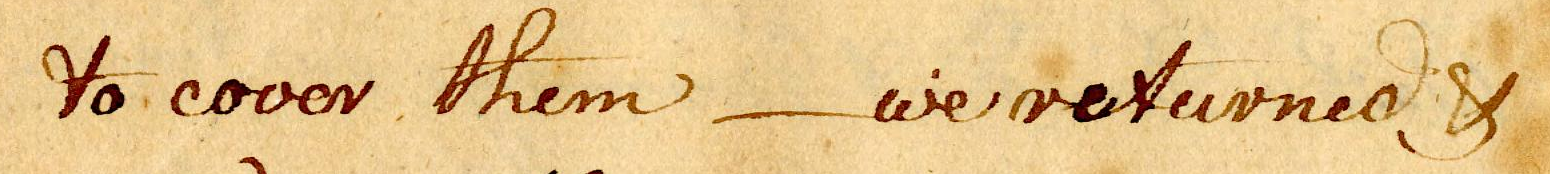to cover them- we returned &
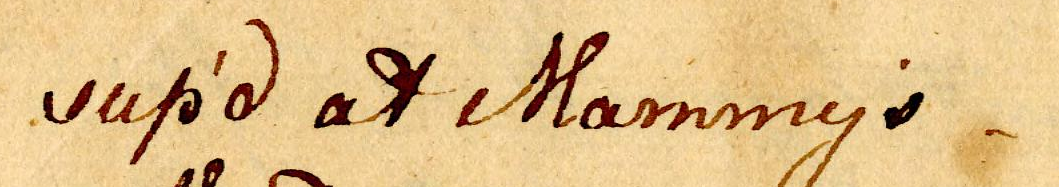sup'd at Mammy's-
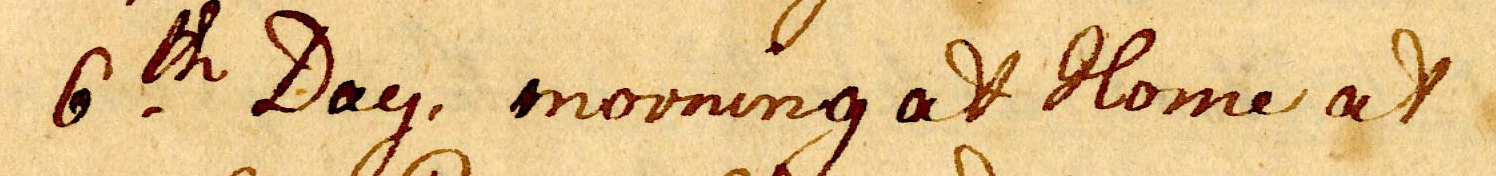6^th. Day, morning at Home at
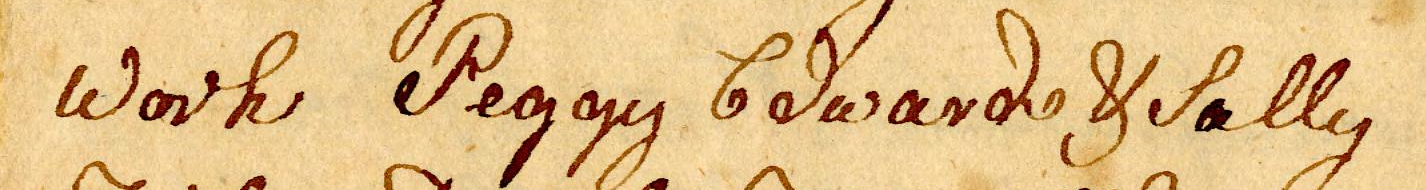Work Peggy Edwards & Sally
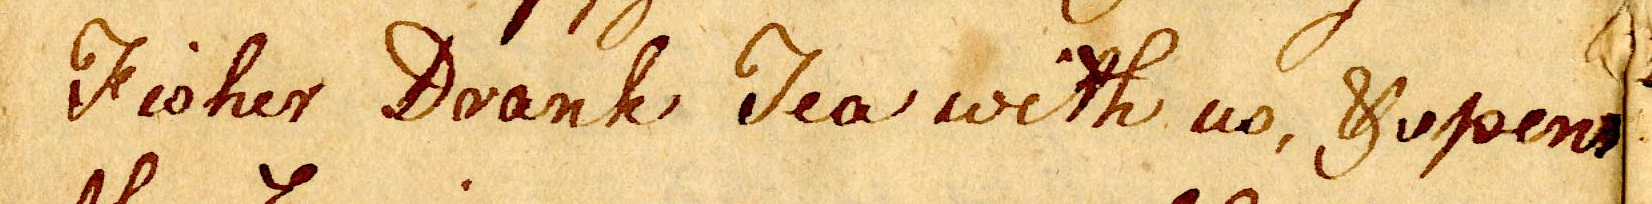Fisher Drank Tea with us, & spent
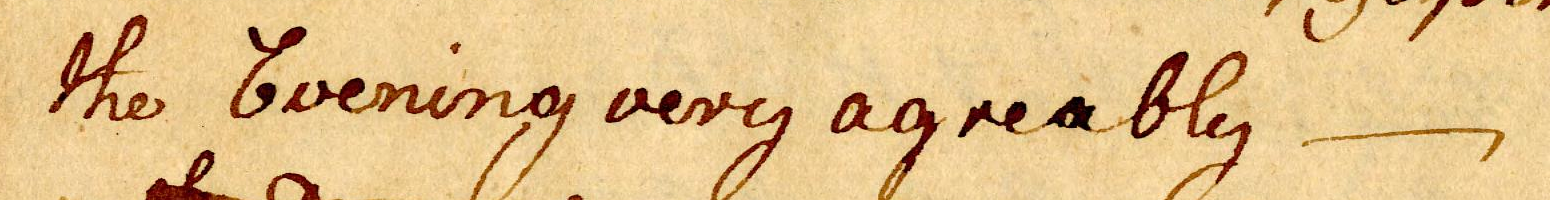the Evening very agreably-
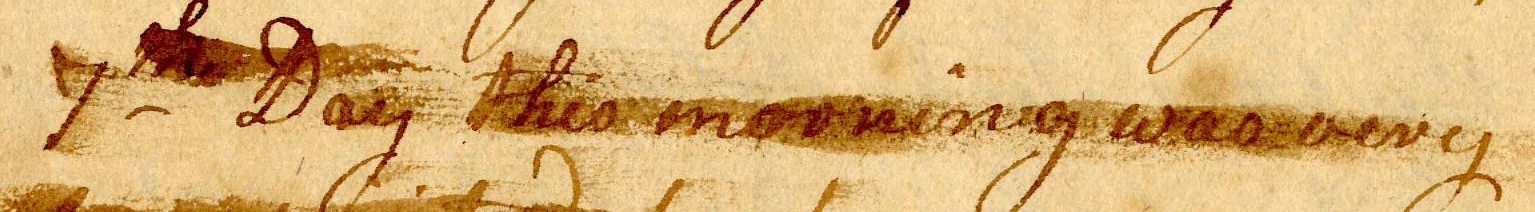7^th Day this morning was very
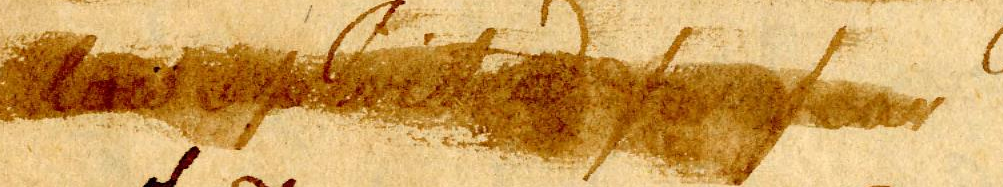low spirited for fear
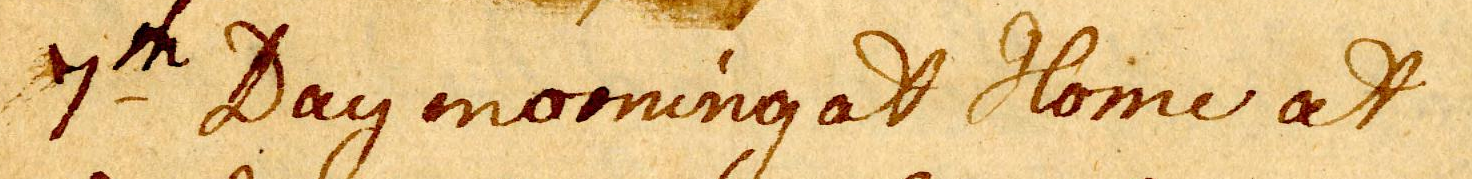7^th Day morning at Home at
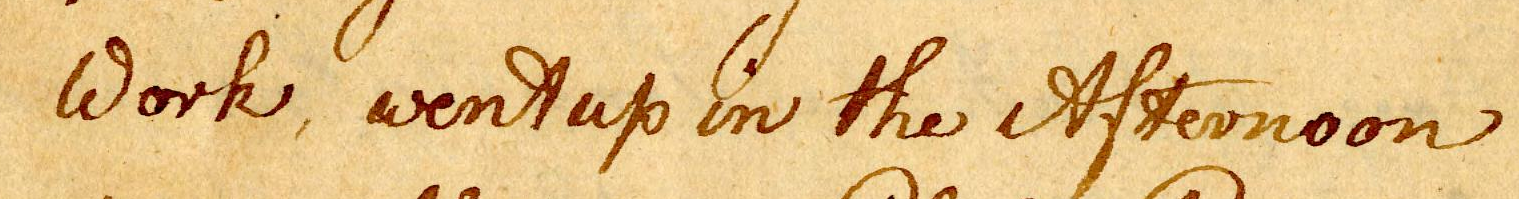Work, went up in the Afternoon
